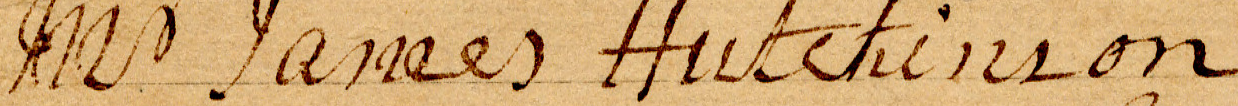M^r. James Hutchinson
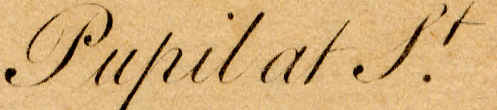Pupil at S^t.
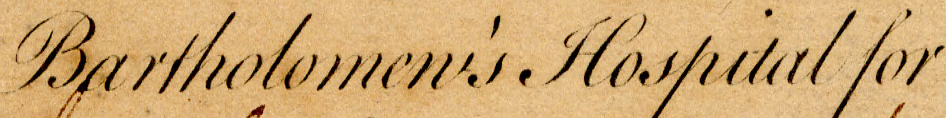Bartholomew's Hospital for
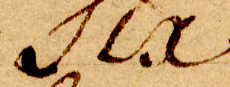Six
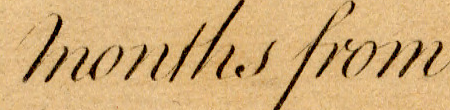months from
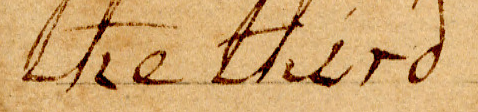the third
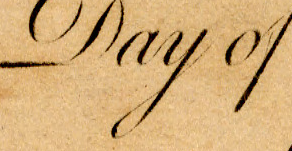Day of
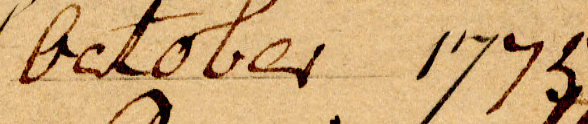October 1775
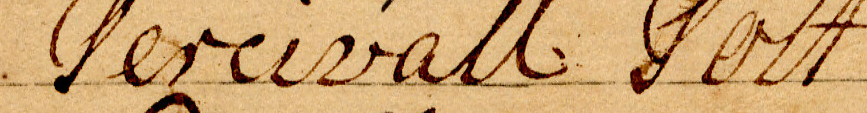Percivall Pott
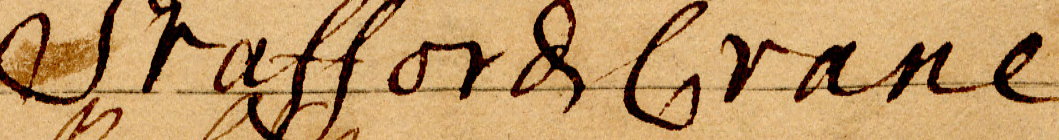Stafford Crane
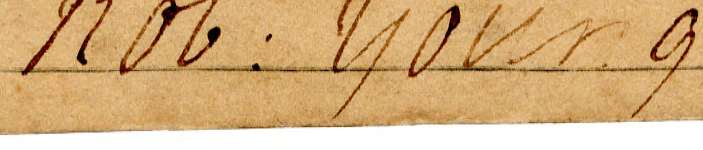Rob: Young
